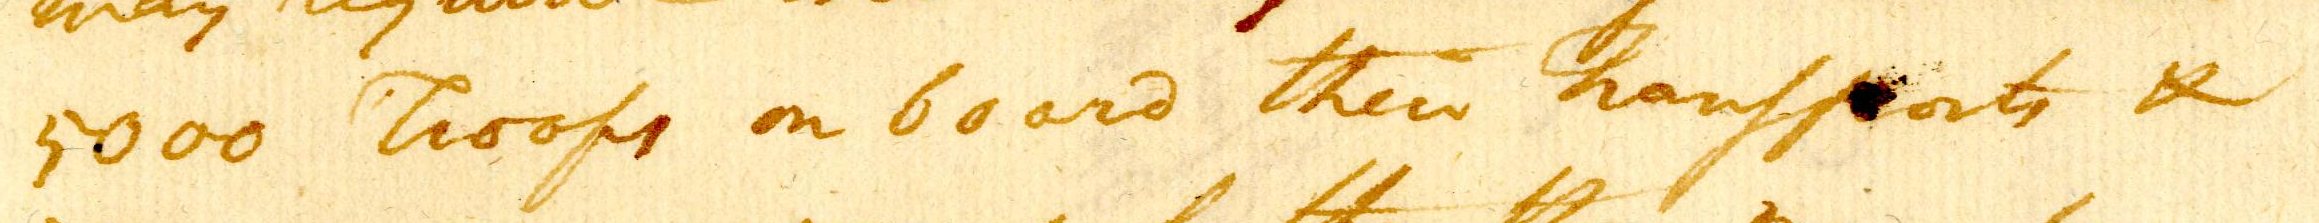5000 troops on board their hausports &
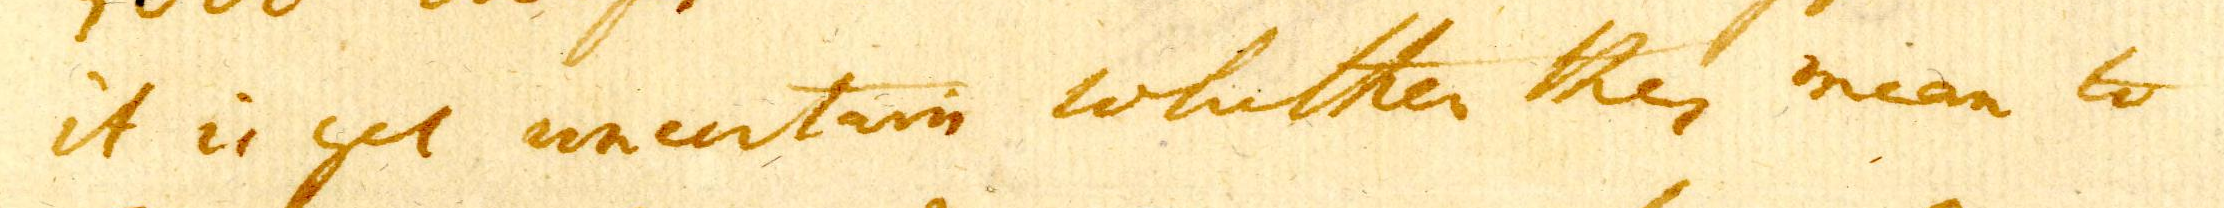it is yet uncertain whether they mean to
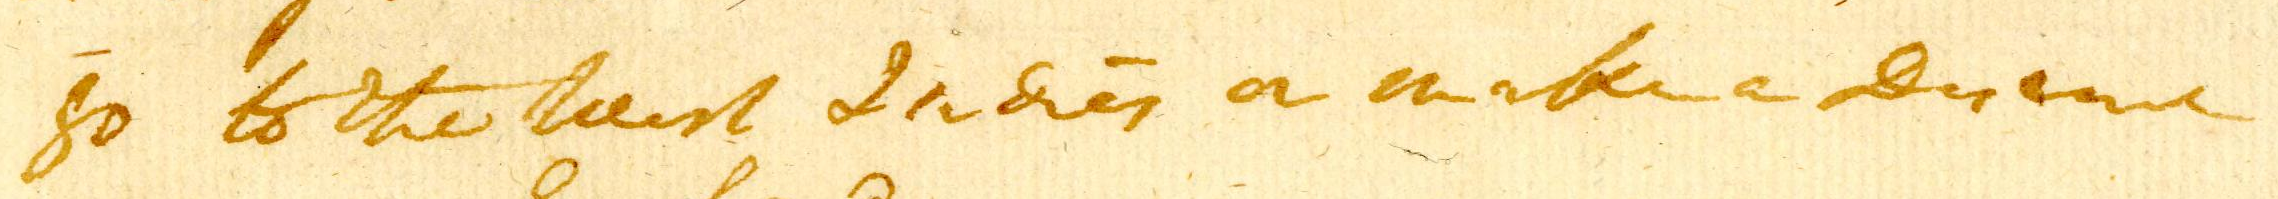go to the West Indies or make a Descent
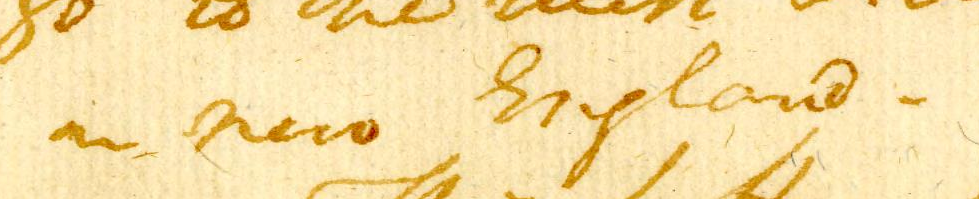on new England.
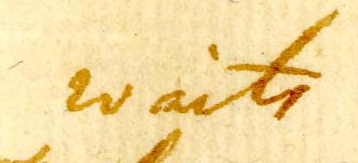waits
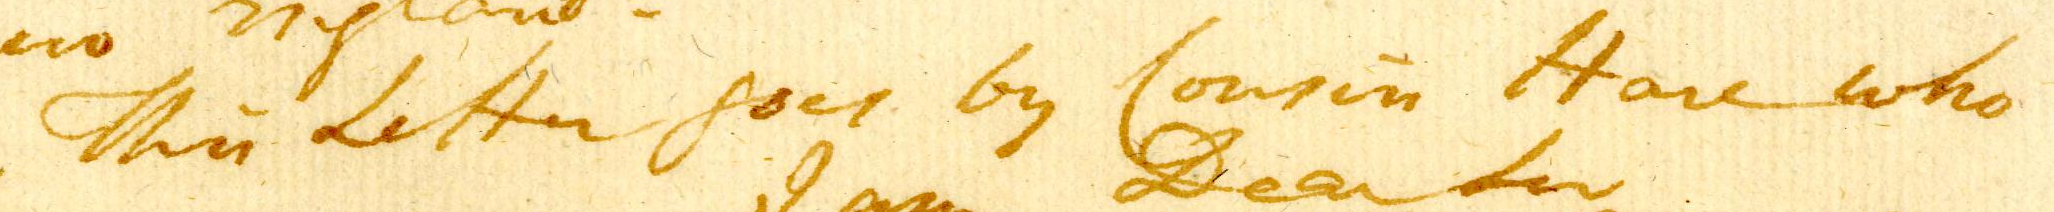This Letter goes by Cousin Hare who
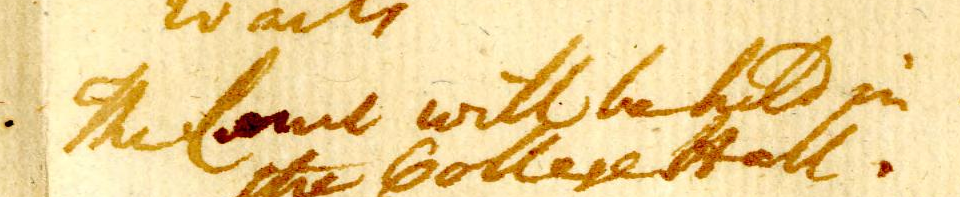The Court will be held in
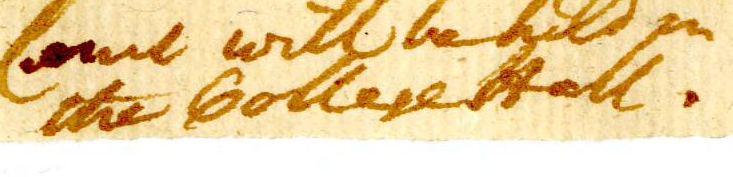the College Hall.
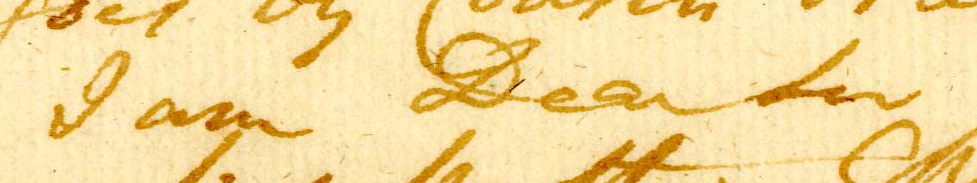I am Dear Sir
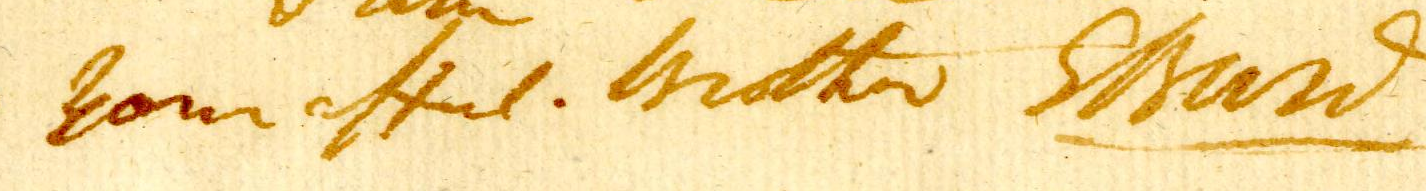your affec. Brother E. Burd
